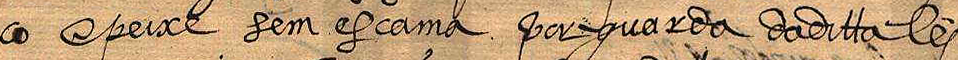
co e peixe sem escama por guarda da ditta lej
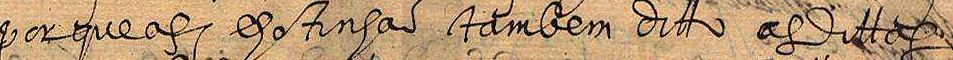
porque asj lho tinhaõ tambem ditto as dittas
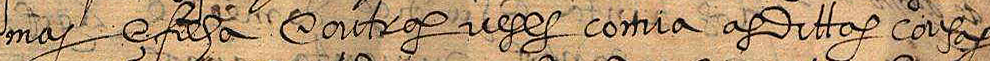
maj e filha e outras ueses comia as dittas cousas
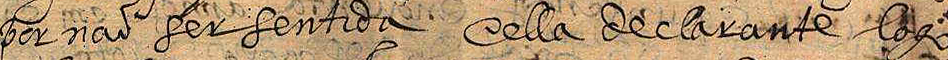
por naõ ser sentida e ella declarante logo
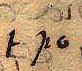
tpo
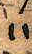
11
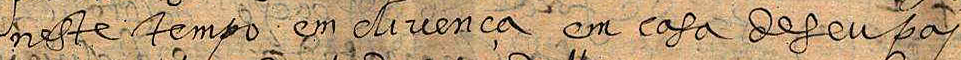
neste tempo em oliuença em casa de seu paj
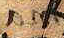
1 R
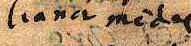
lianor mēdes
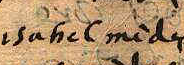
isabel mēdes
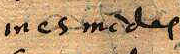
ines mēdes
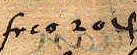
frco rois
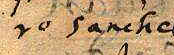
ro sanches
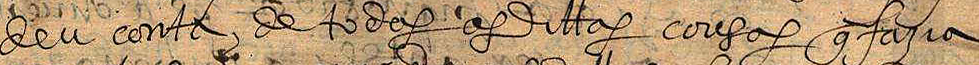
deu conta, de todas as dittas cousas q̄ fazia
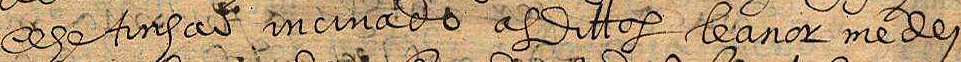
e lhe tinhaõ incinado as dittas leanor mēdez
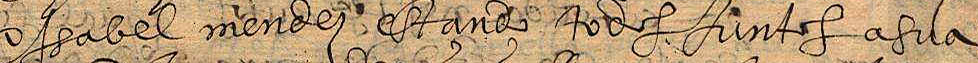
e Jsabel mendez estando todos Juntos a sua
